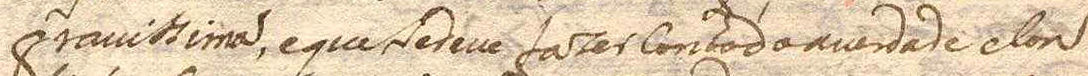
grauissima, e que se deue fazer Con toda a uerdade, e Con
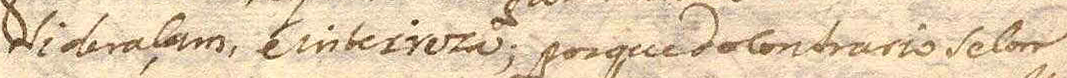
sideraÇam, e inteireza; porque do contrario se Con
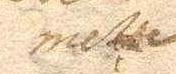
mette
